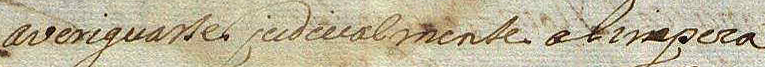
averiguarse judicialmente a limpeza
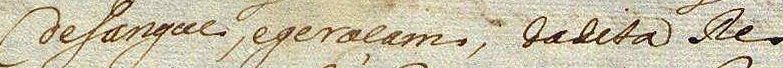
de sangue, e geraçam, da dita Re
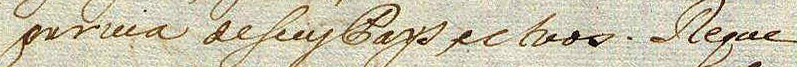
por uia de seus Pays, e Avos. Reque
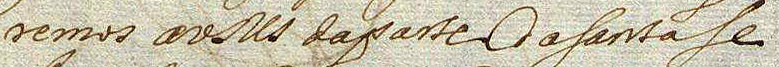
remos a v Ms da parte da santa se
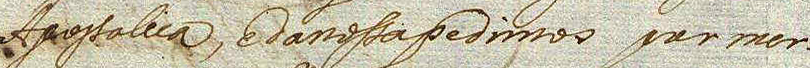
Apostolica, e da nossa pedimos por mer
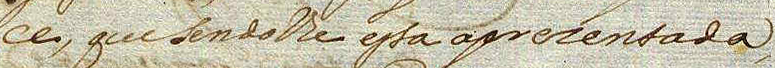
ce, que sendolhe esta aprezentada,
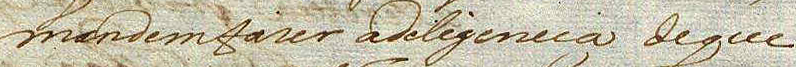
mandem fazer a deligencia de que
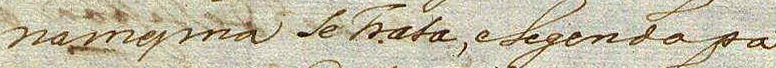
na mesma se trata, elegendo pa
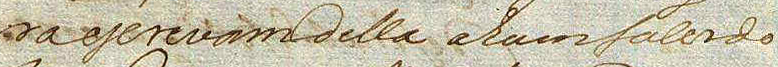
ra escrivam della a hum sacerdo
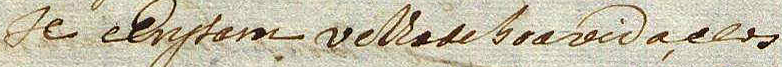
te Christam velho de boa vida, e cos
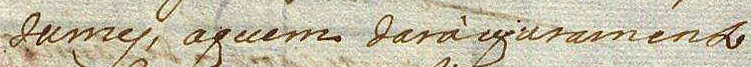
tumes, a quem darà o juramento
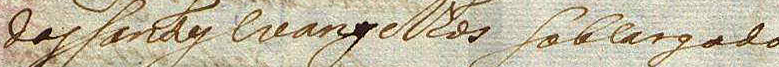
dos santos evangelhos sob cargo do
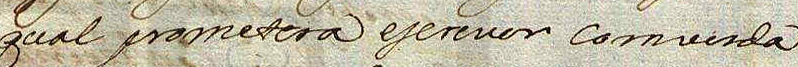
qual prometera escrever com verda
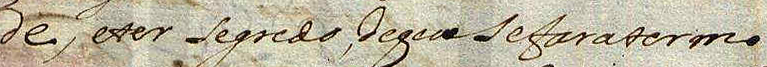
de, e ter segredo, de que se fara termo
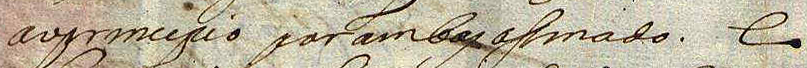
ao principio por ambos assinado. E
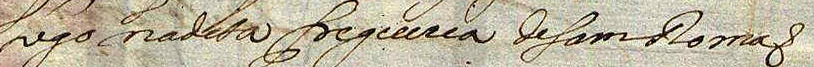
Logo na dita freguezia de sam Romaõ
